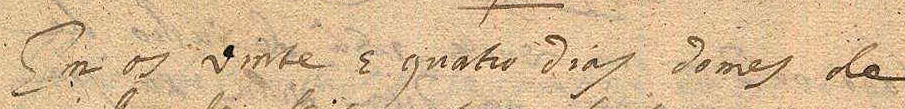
Em os vinte E quatro dias do mes de
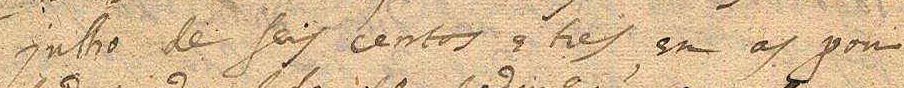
julho de seiscentos E tres, Em as pou
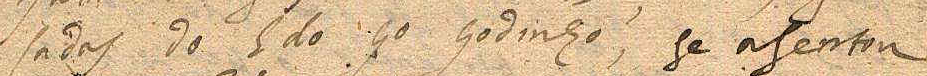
sadas do ldo Go Godinho, se asentou
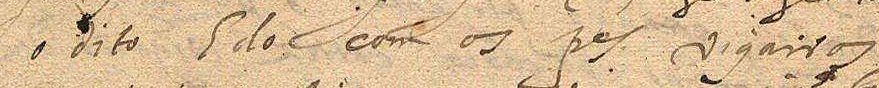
o dito ldo com os pes vigairos
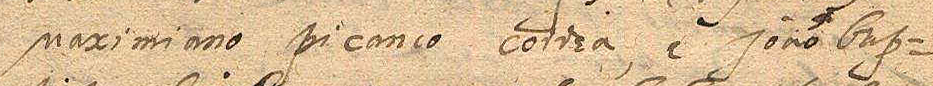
Maximiano picanço correa, e Joaõ bap
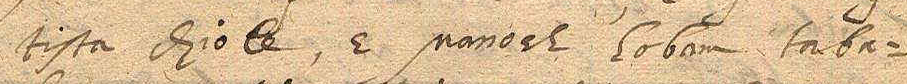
tista chiole, E Manoel lobam taba
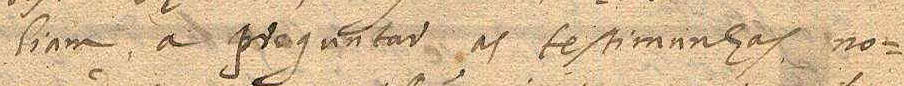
liam, a preguntar as testimunhas no
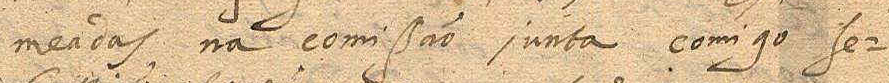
meadas na comissaõ junta comigo se
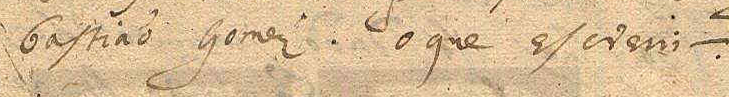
bastiaõ Gomez̄. o que Escreui -
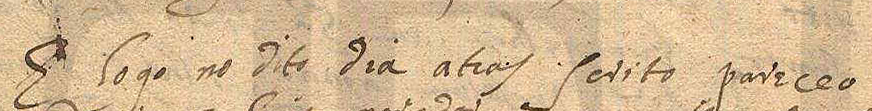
E logo no dito dia atras scrito pareceo
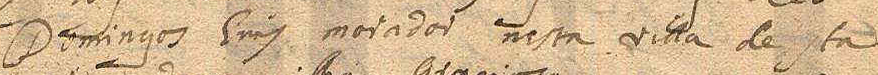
Domingos luis morador nesta villa de sta
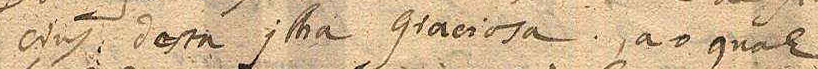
crus desta jlha Graciosa, ao qual
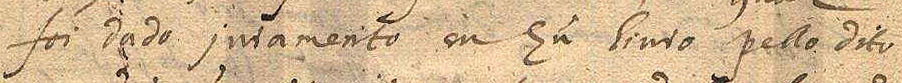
foi dado juramento em hū liuro pello dito
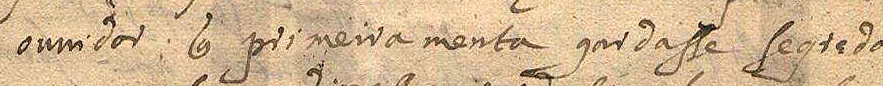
ouuidor q̄ primeiramenta gardasse segredo
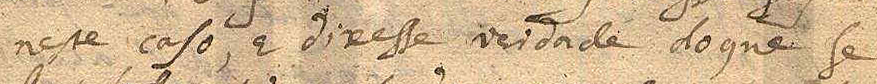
neste caso, E dixesse verdade do que se
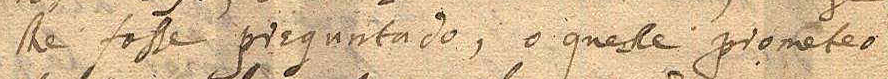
lhe fosse preguntado, o que lle prometeo
